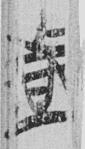者
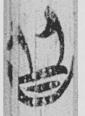皆
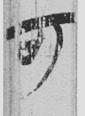可
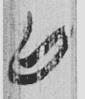㠯（以）
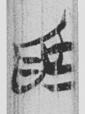爲
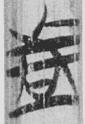者（諸）
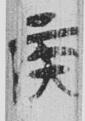侯
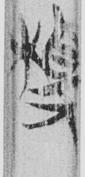○（相）
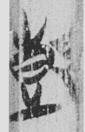○（矣）
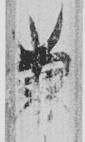東
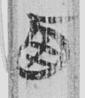西
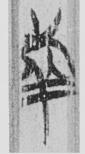南
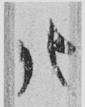北
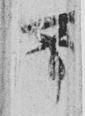不
